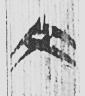文
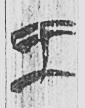王
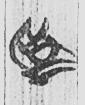爲
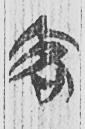客
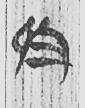於
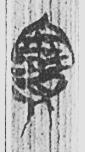賽
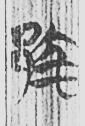○（蔡）
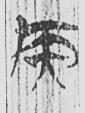侯
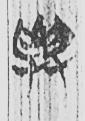與
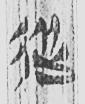從
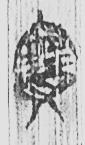賽
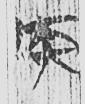侯
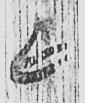㠯（以）
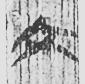文
